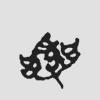𡄹
